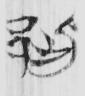{此阝}
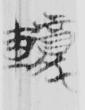輹
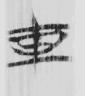車
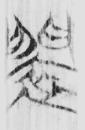{門衣衣}
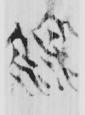{介水介水}
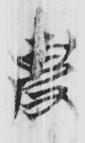尅
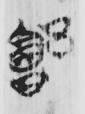鄶
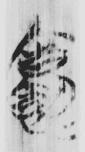{宀屮田食刀}=
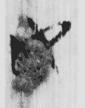女
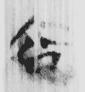容
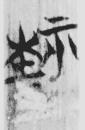{示𡉣}
